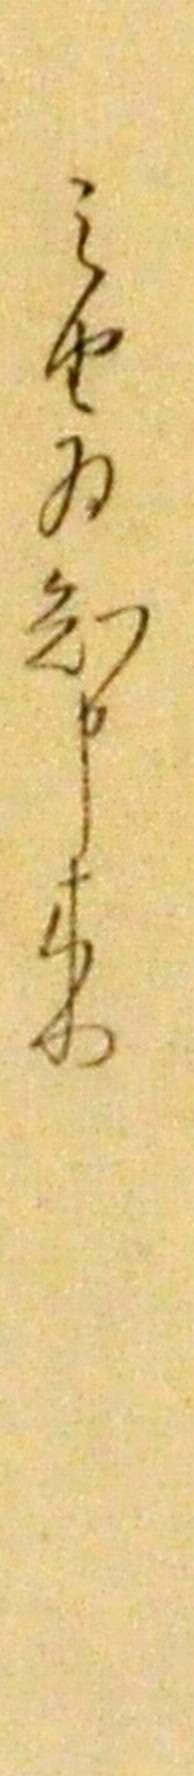之由為知申来
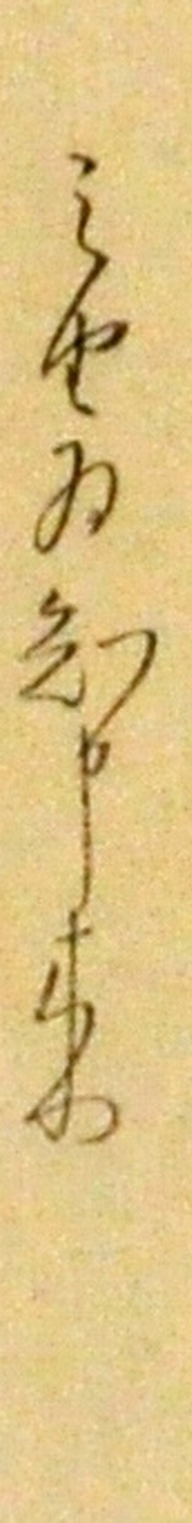之由為知申来
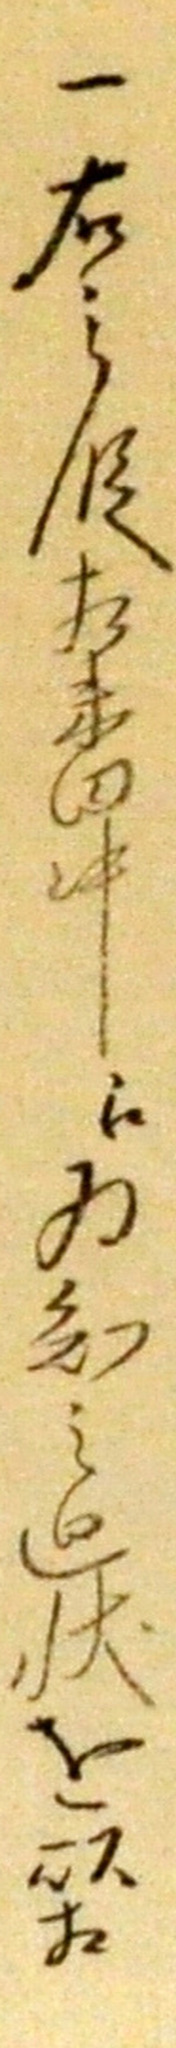一右之段相番中え為知之廻状を以相
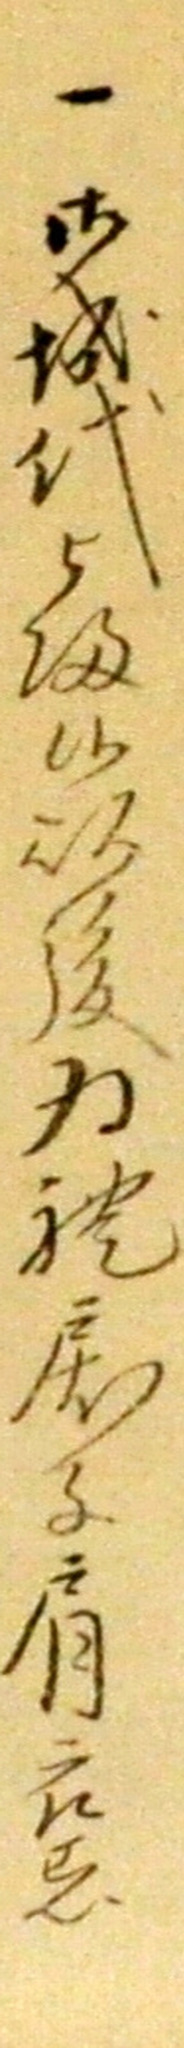一御城代被帰候以後為礼戻子肩衣着
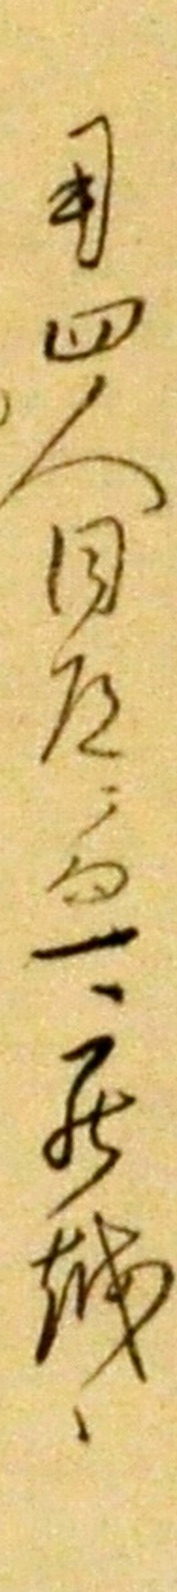用四人同道に而可罷越候
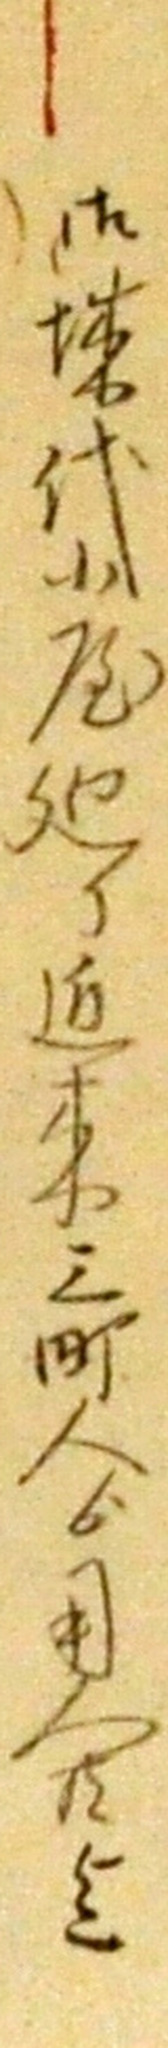御城代小屋廻り近来三町人ゟ用人共迄
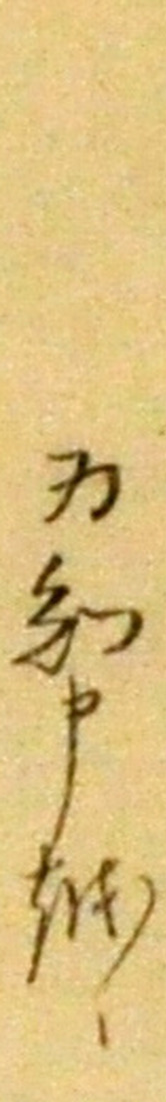為知申越候
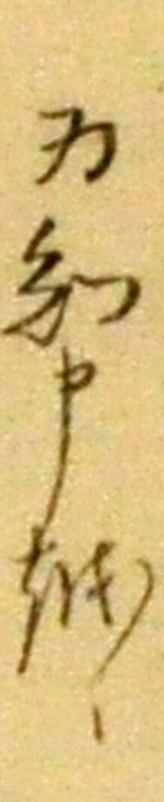為知申越候
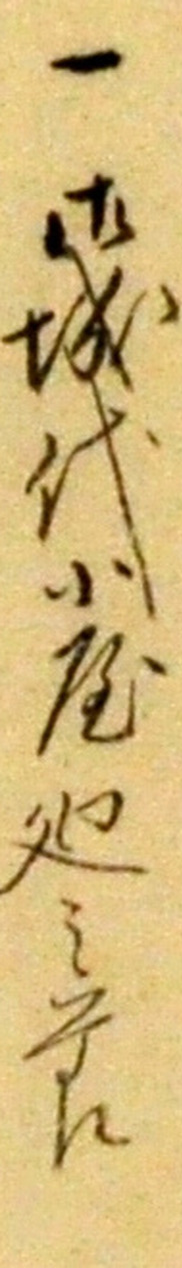一御城代小屋廻之節
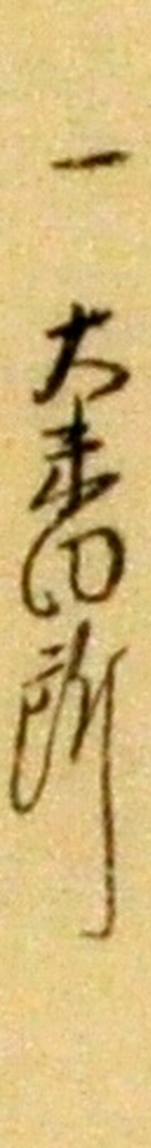一大番所
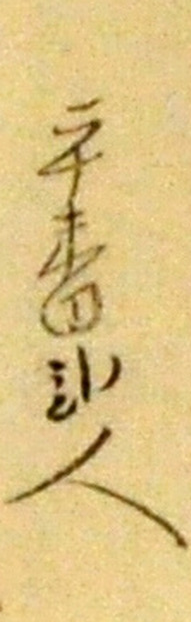下番弐人
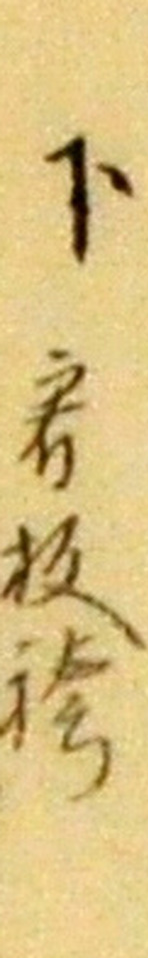下看板袴
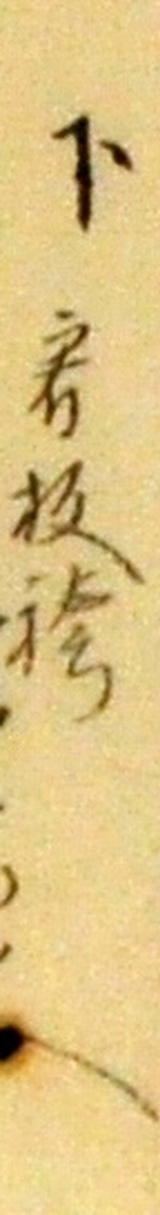下看板袴
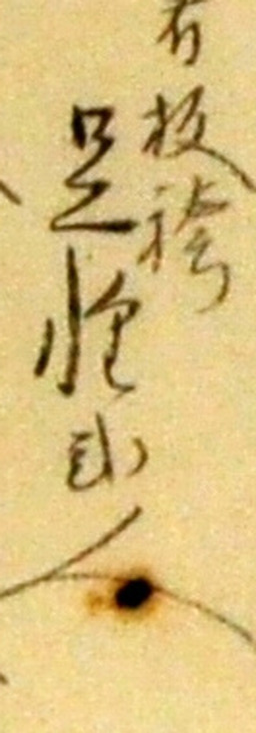足軽弐人
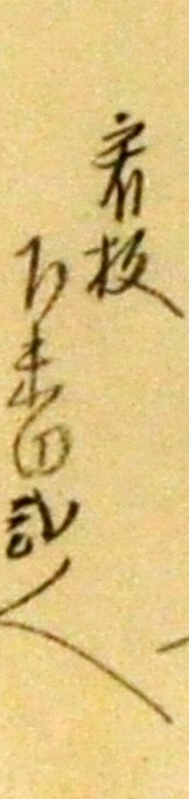下番弐人
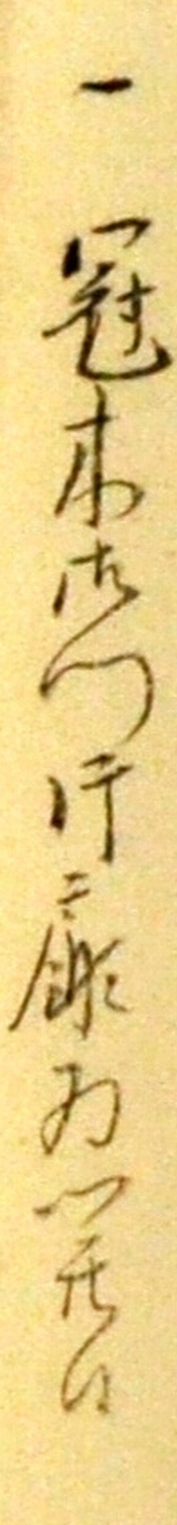一冠木御門片扉為開候
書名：大阪加番関係諸書留〔一括〕
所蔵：伊那市立高遠町図書館・合同会社AMANE
